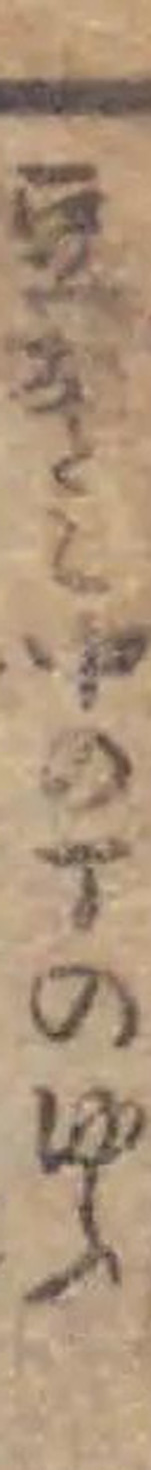豆おとこ中の丁のゆふ
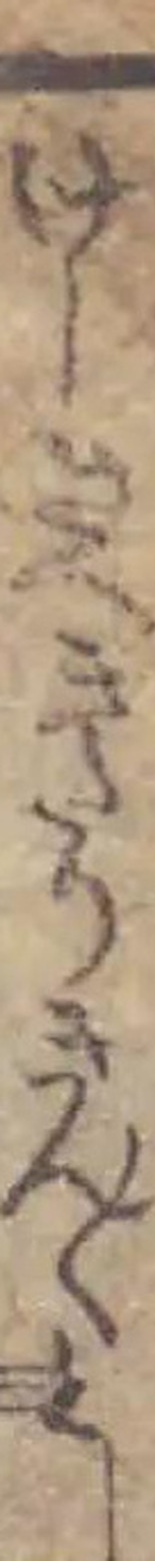けしきへきたりきん〳〵と
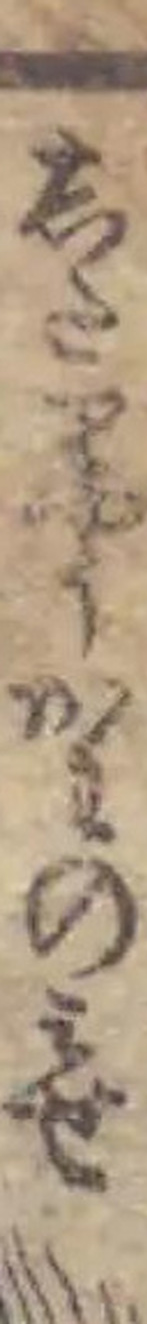したりやうかわのミせ
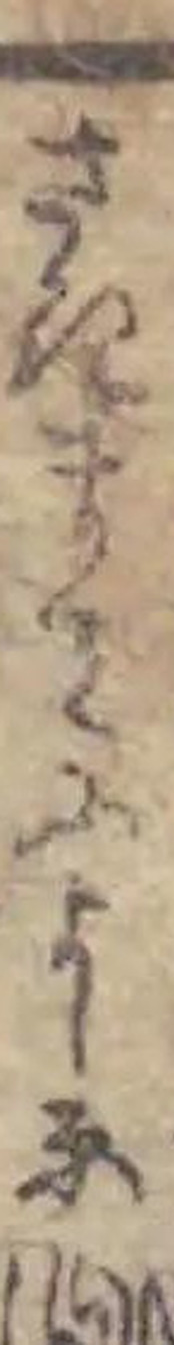さきまてによし原
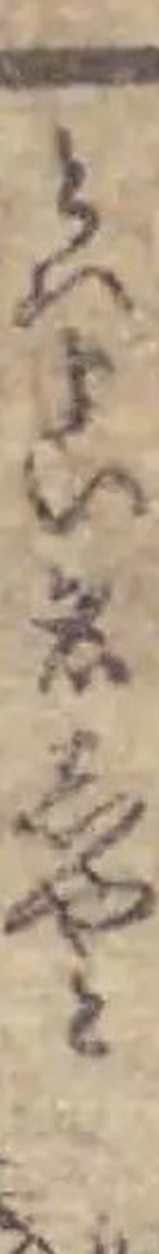とハよい名しやと
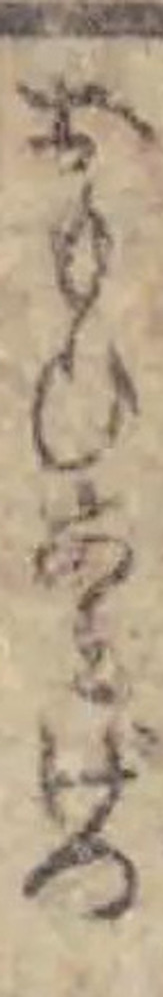おもひあとげつ
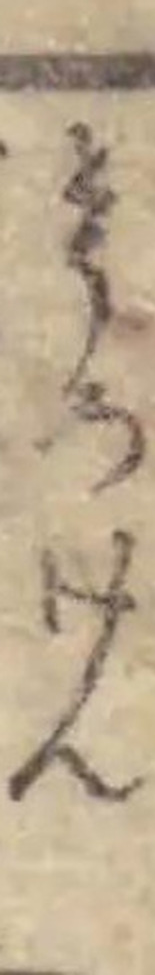とうろけん
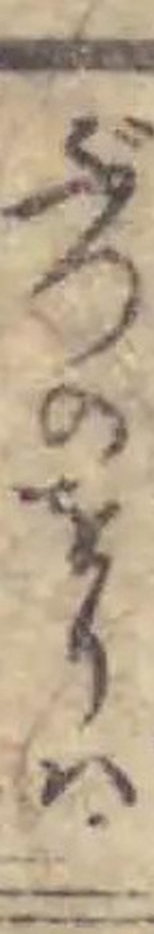ぶつのをりハ
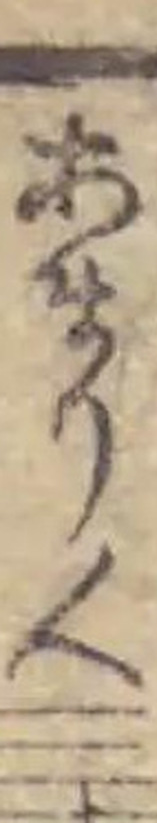あまり人
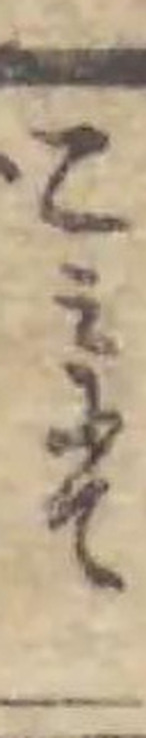こミにて
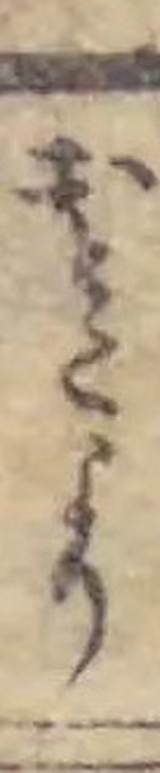おとこより
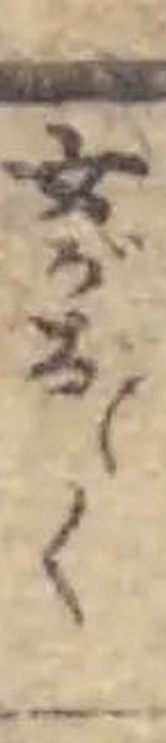女がおゝく
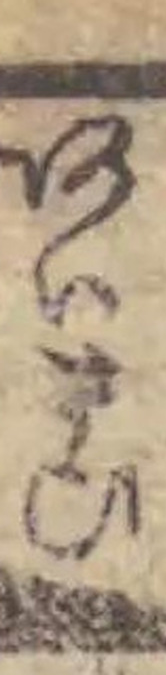あいさひ
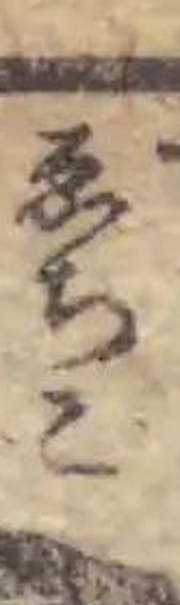ゑちこ
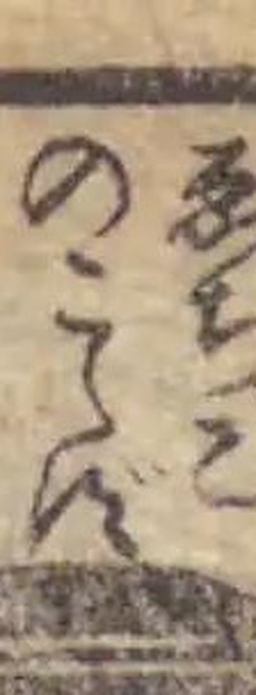のこらず
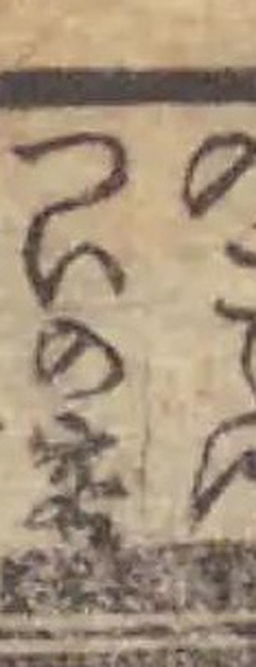ついの客
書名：豆男江戸見物 2巻
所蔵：国立国会図書館 National Diet Library, JAPAN
